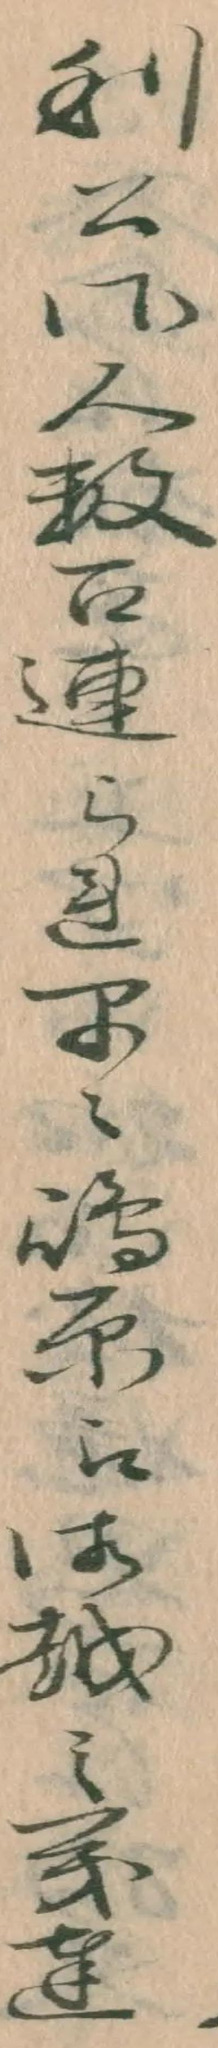利公御人数召連ら連早々島原江御越之義達
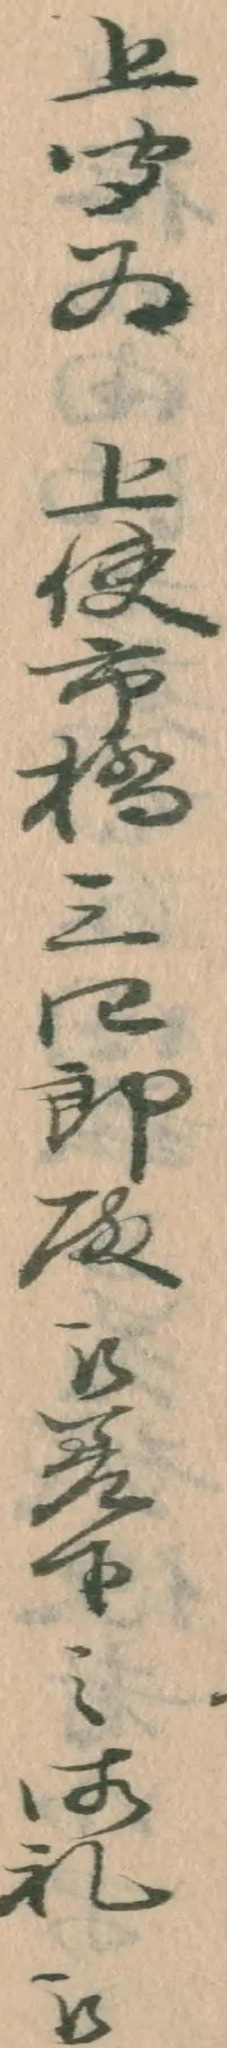上聞ゐ上使市橋三四郎殿被差下之御礼被
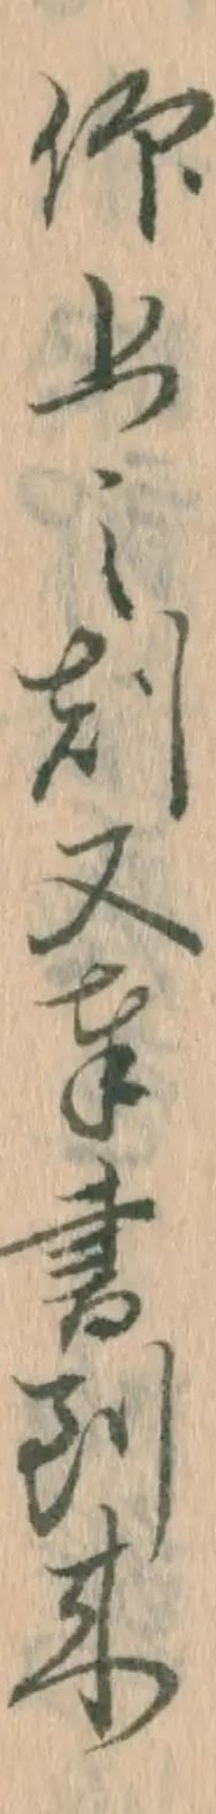仰上之刻又奉書到来
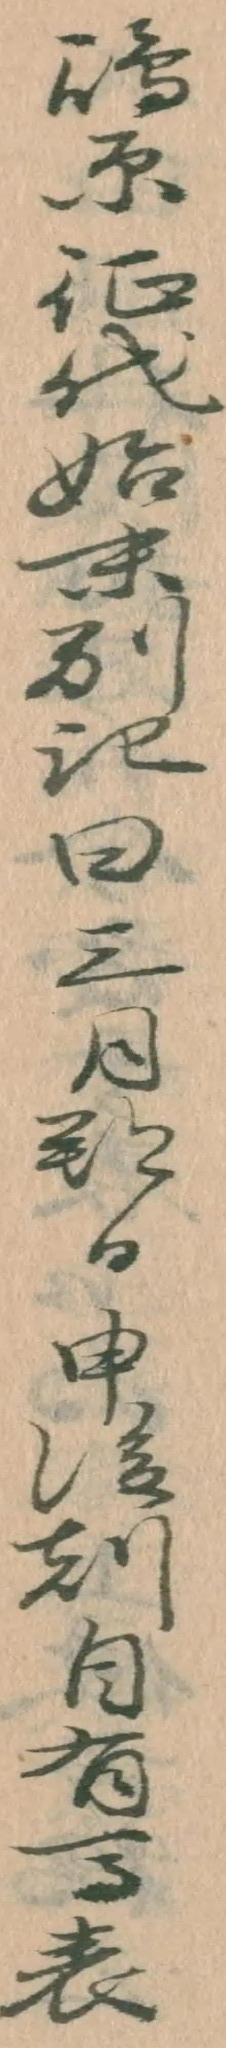島原征伐始末別記曰三月朔日申後刻自有馬表
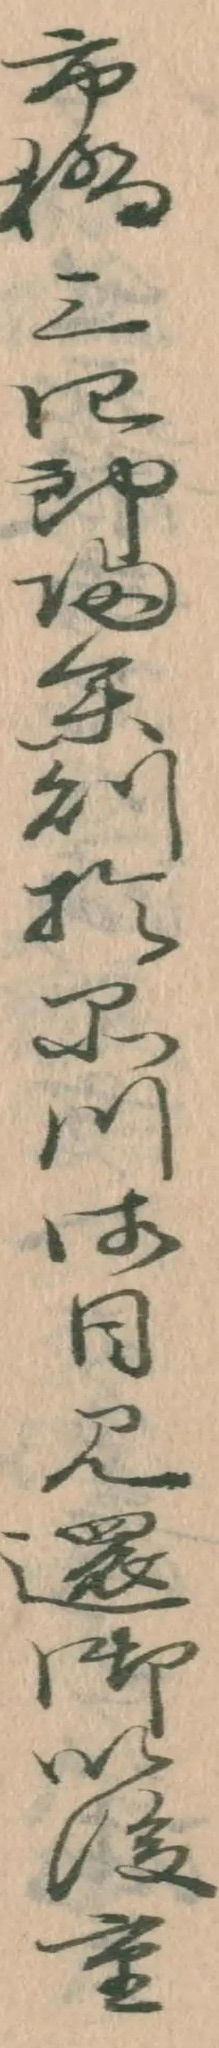市橋三四郎帰参則於品川御目見還御以後重
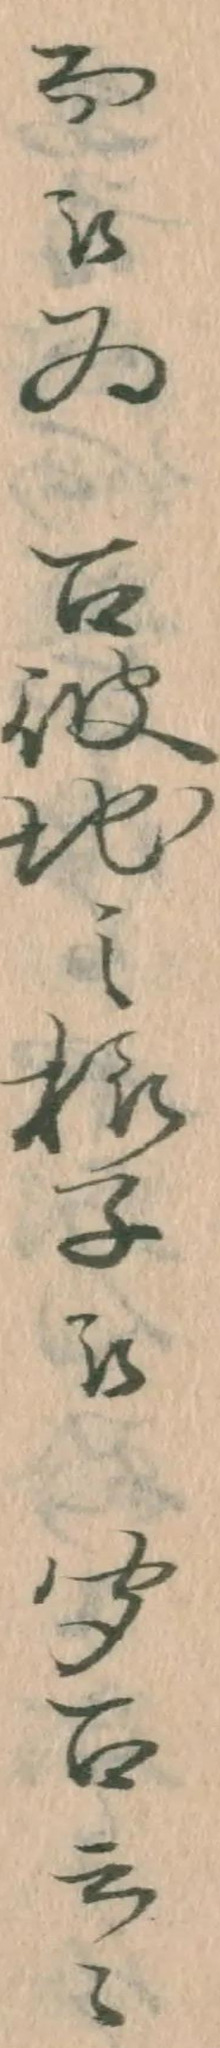而被ゐ召彼地之様子被聞召云々
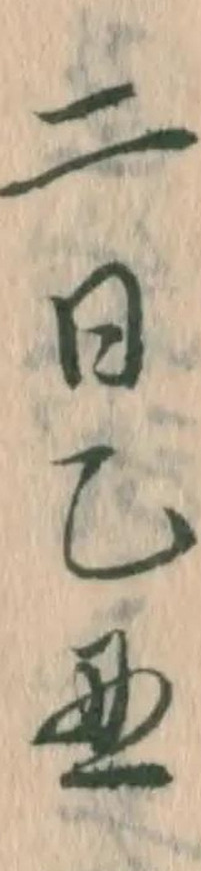二日乙丑
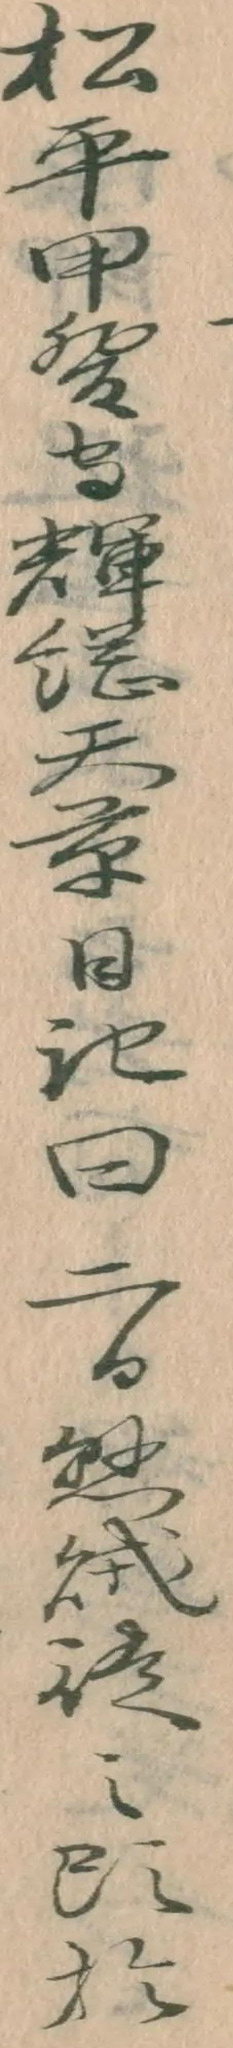松平甲斐守輝綱天草日記曰二日懸賊徒之頭於
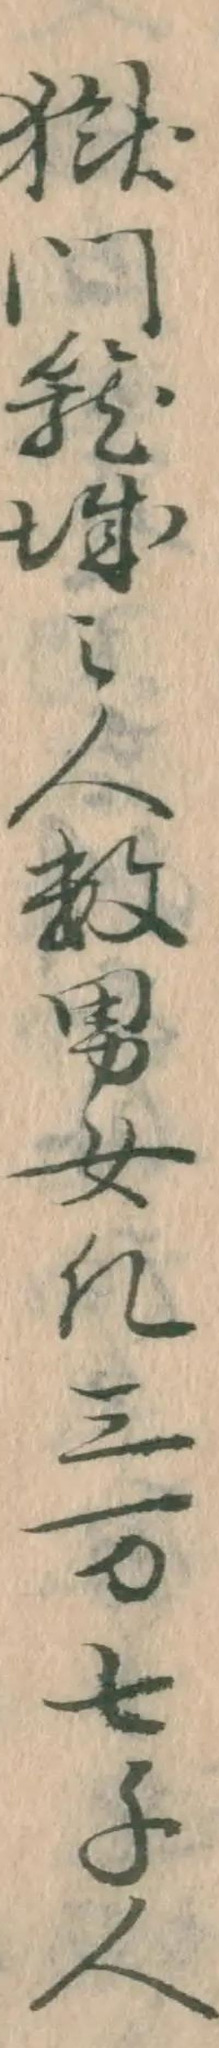獄門籠城之人数男女凡三万七千人
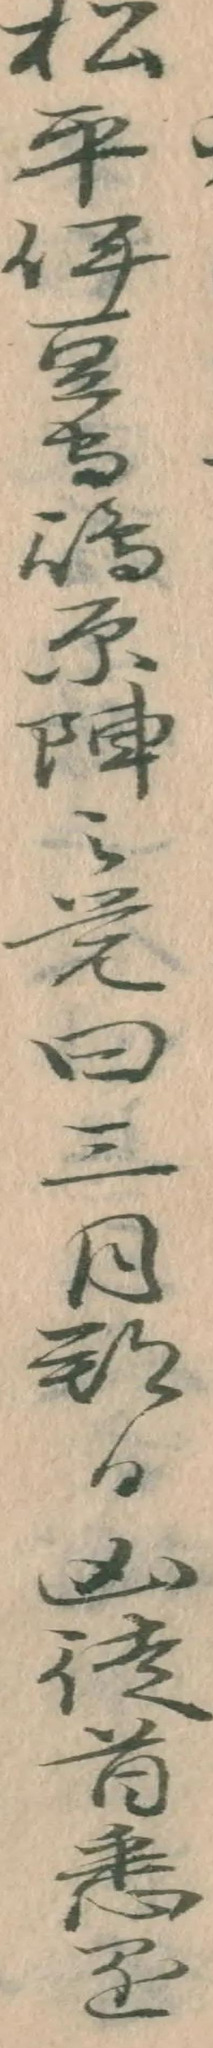松平伊豆守島原陣之覚曰三月朔日凶徒首悉懸
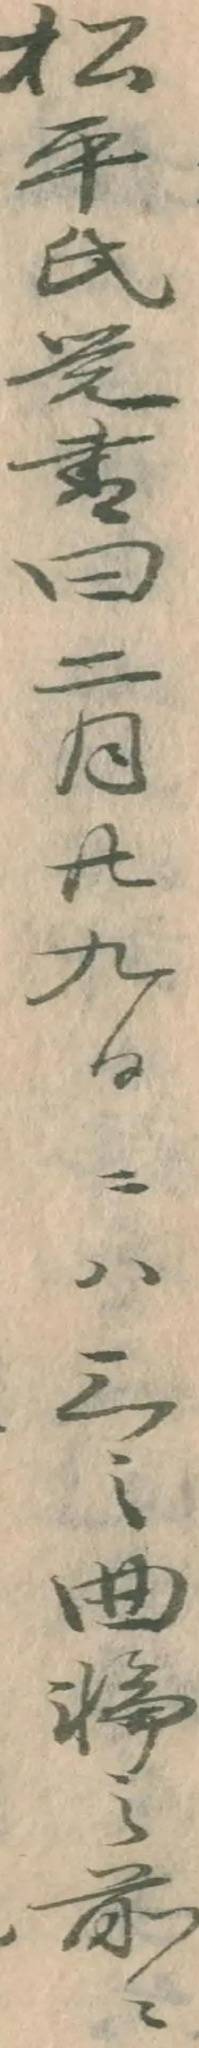松平氏覚書曰二月廿九日には三之曲輪之前に
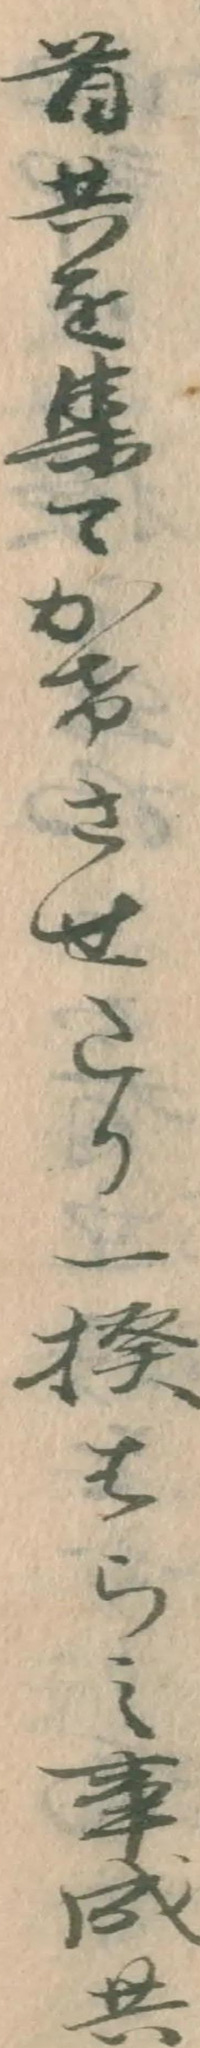首共を集てか希させたり一揆者らみ事成共

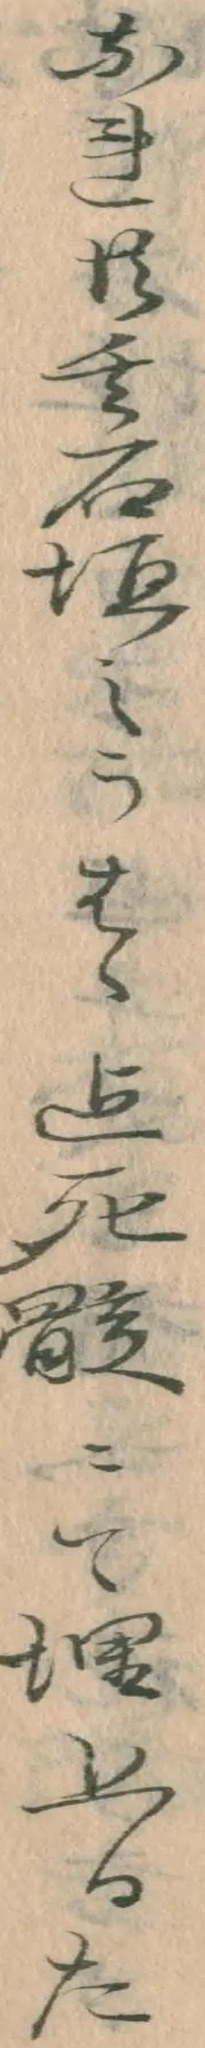な連共其石垣之う者々迄死骸にて埋上るた
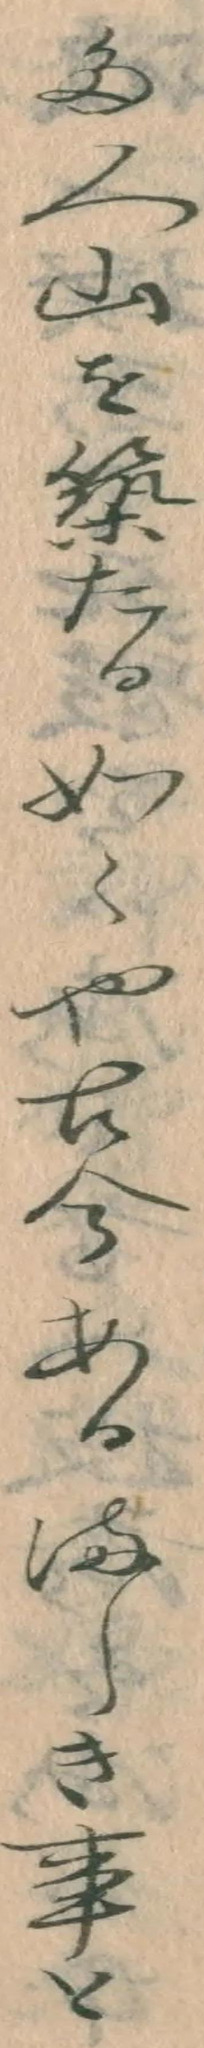多人山を築たる如く也古今ある満しき事と
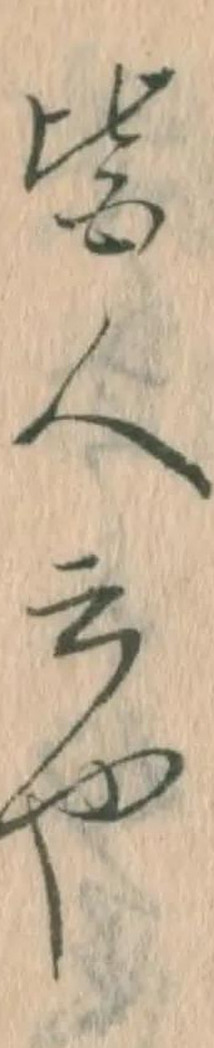皆人云也
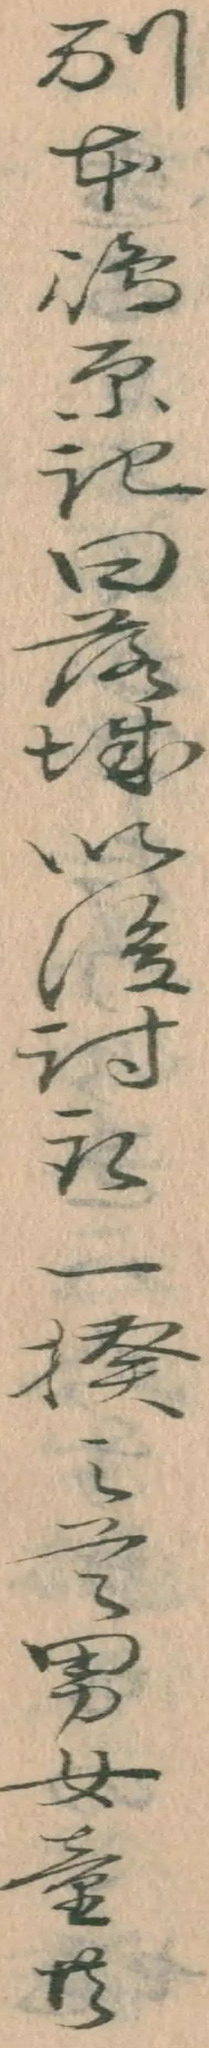別本島原記曰落城以後討取一揆之首男女童共
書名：切支丹御退治記 49巻. [9]
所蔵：国立国会図書館 National Diet Library, JAPAN
